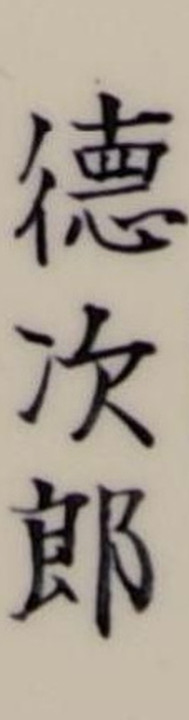徳次郎
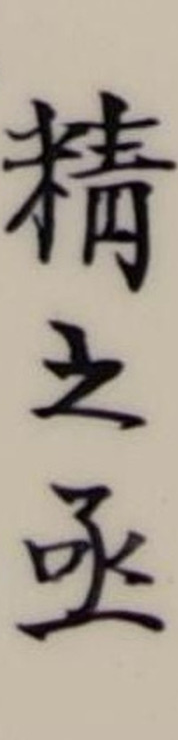精之丞
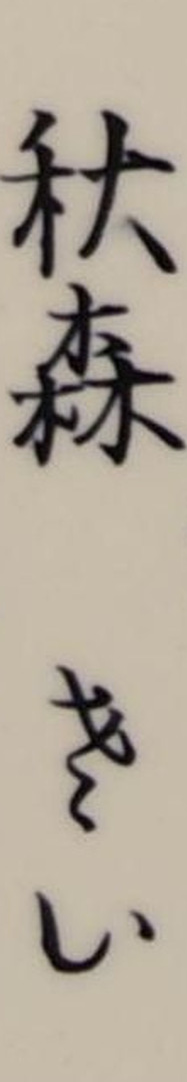秋森さい
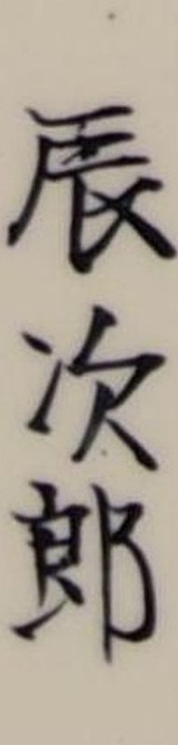辰次郎
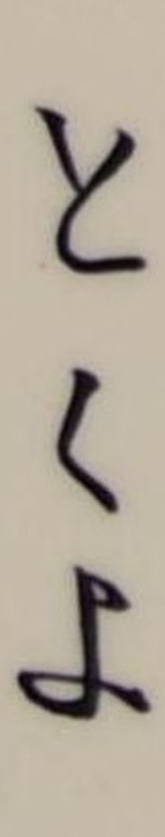とくよ
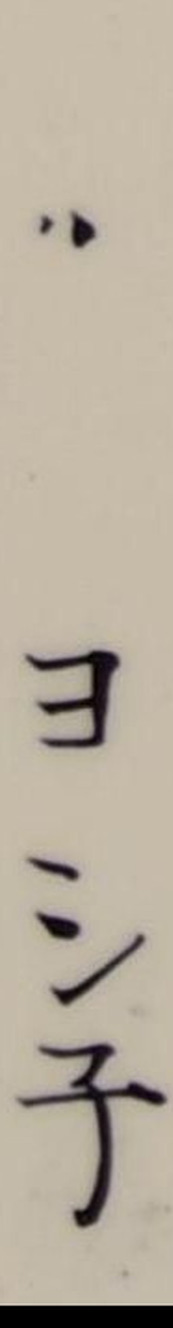ヨシ子
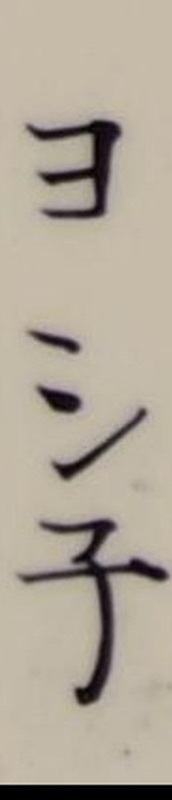ヨシ子
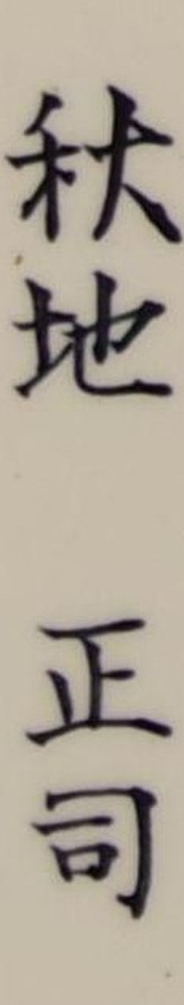秋地正司
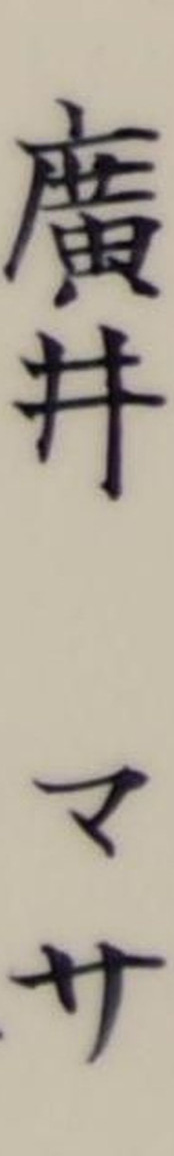廣井マサ
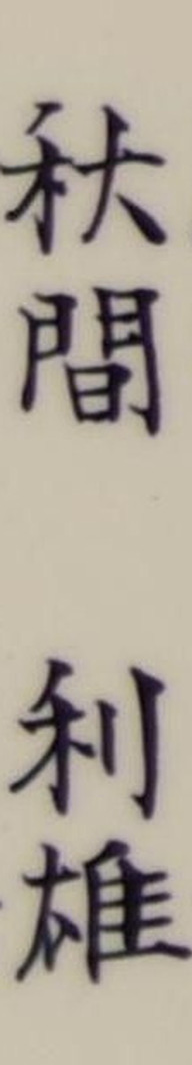秋間利雄
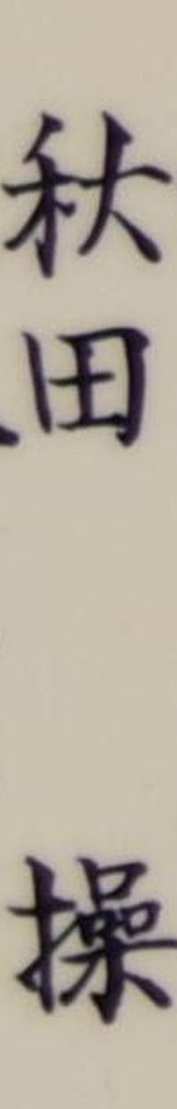秋田操
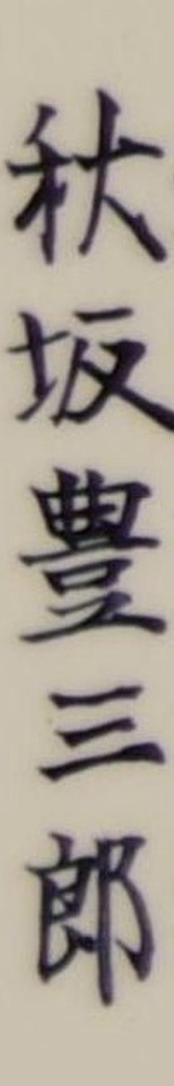秋坂豊三郎
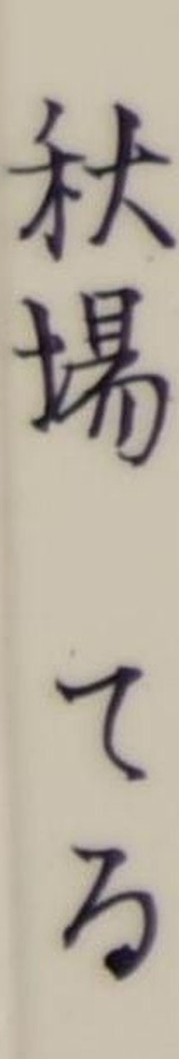秋場てる

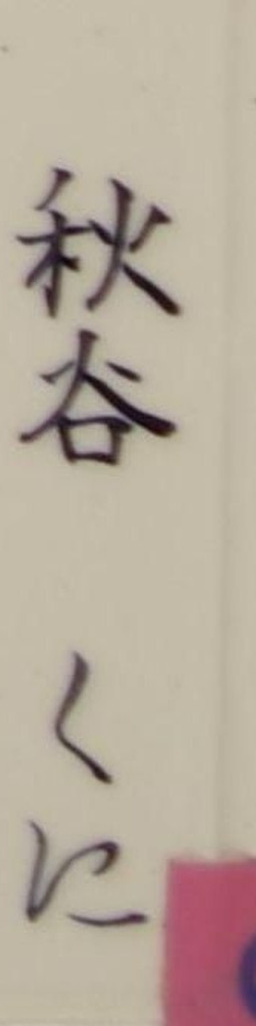秋谷くに
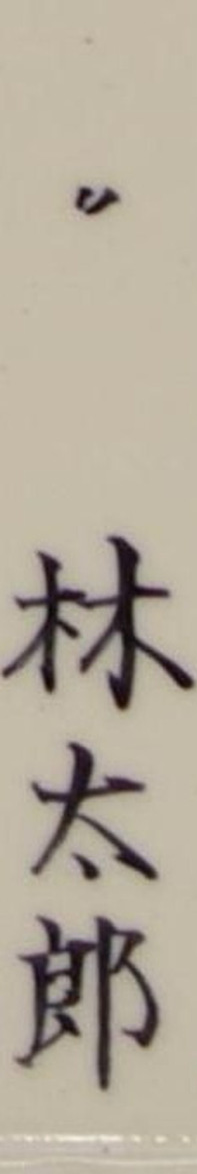林太郎
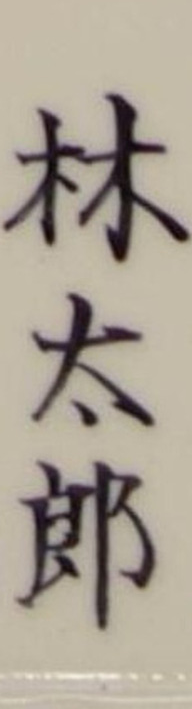林太郎
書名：E~L
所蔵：高野山金剛峯寺
